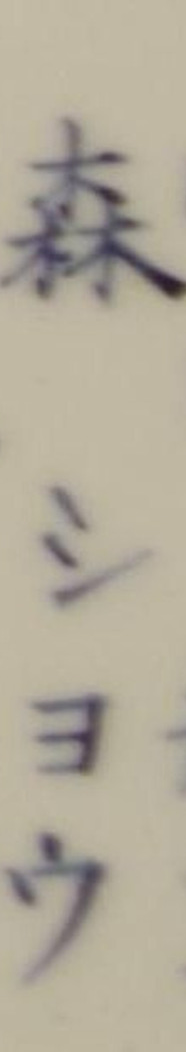森シヨウ
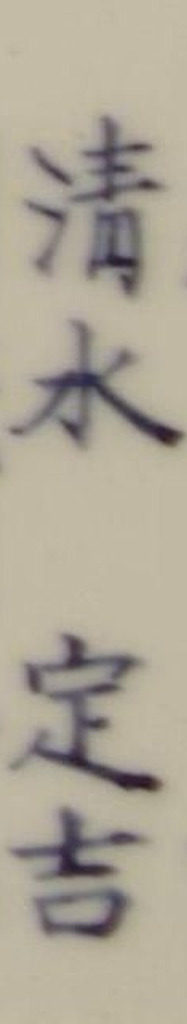清水定吉
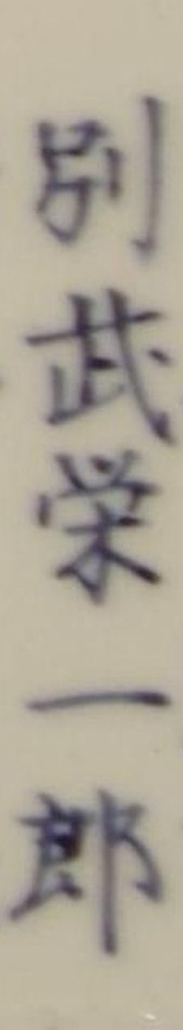別武栄一郎
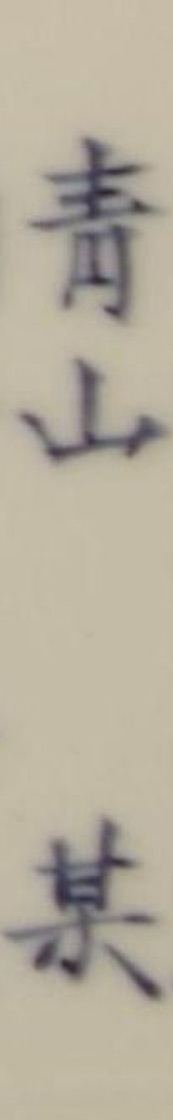青山某
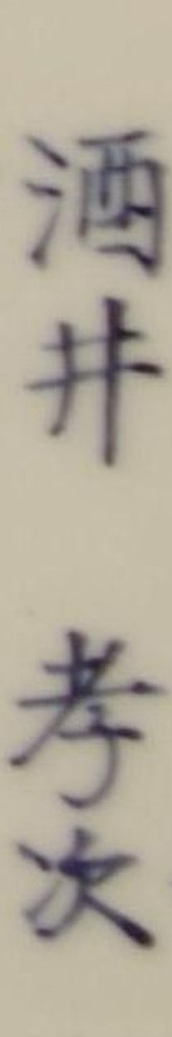酒井孝次
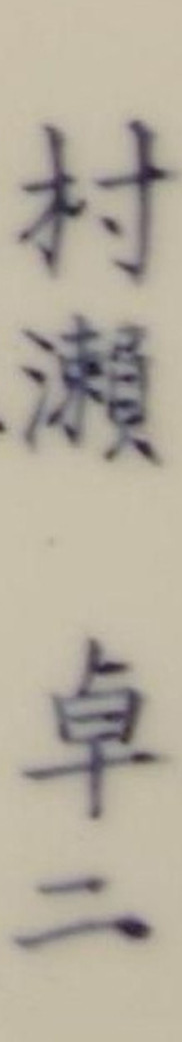村瀬卓二
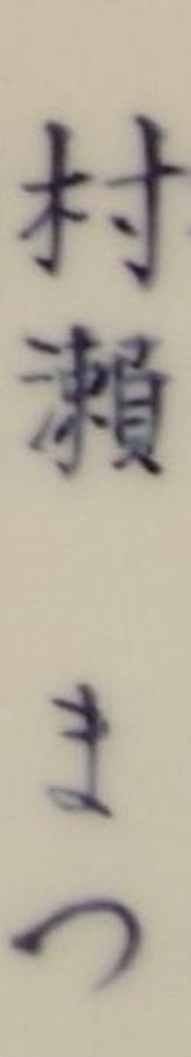村頼まつ
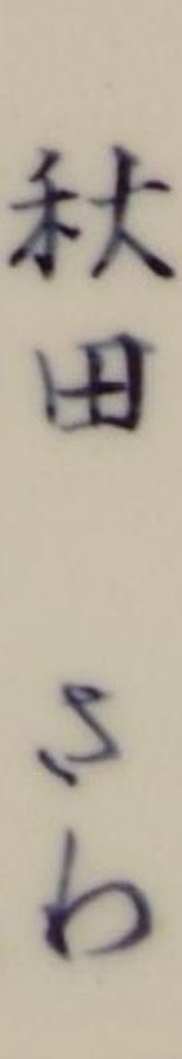秋田さわ
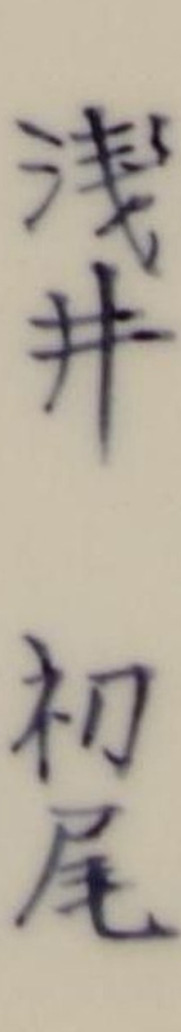浅井初尾
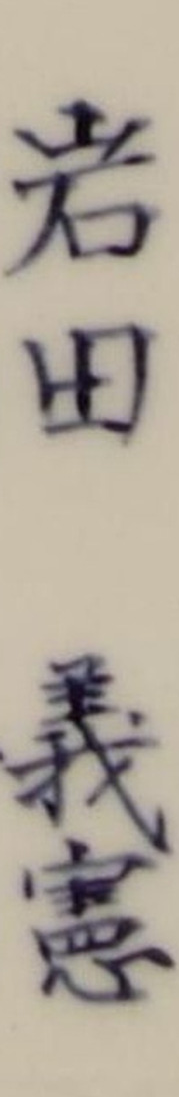岩田義憲
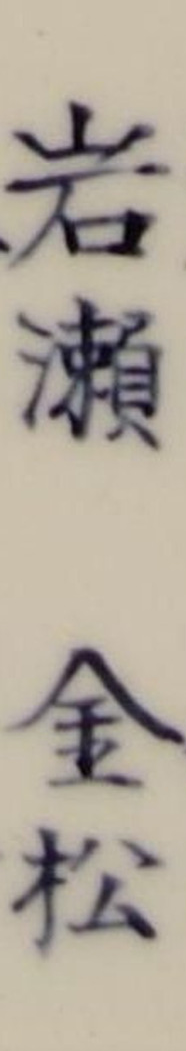岩瀬金松
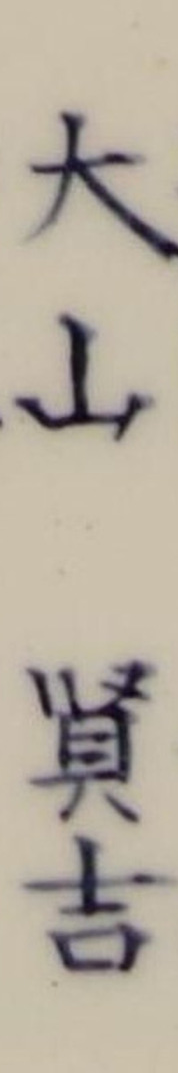大山賢吉
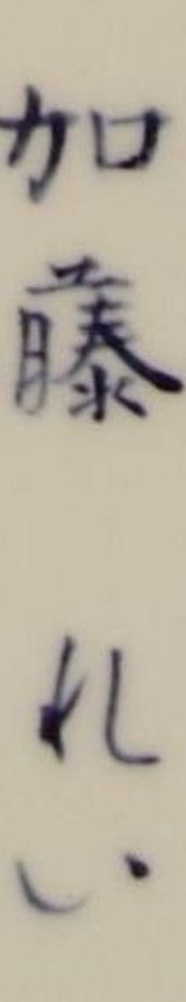加藤れい
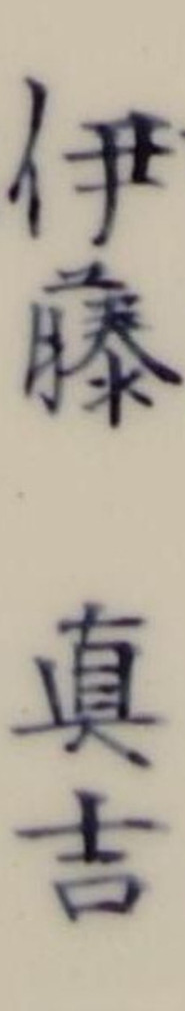伊藤真吉
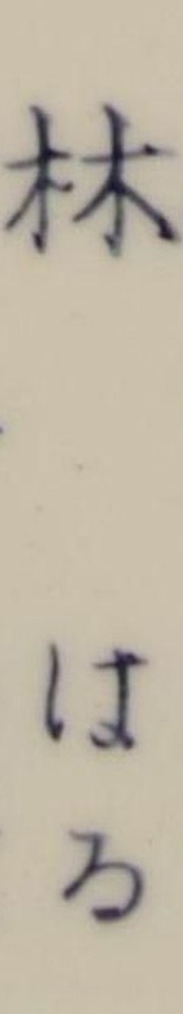林はる
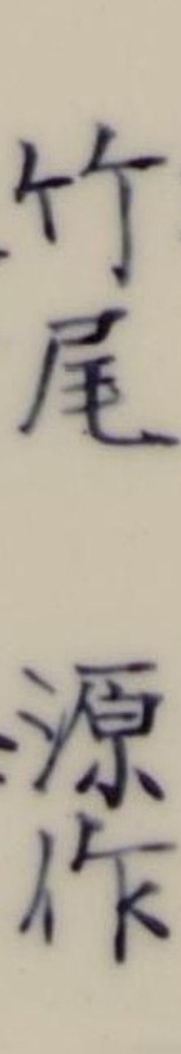竹尾源作
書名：E~L
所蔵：高野山金剛峯寺
